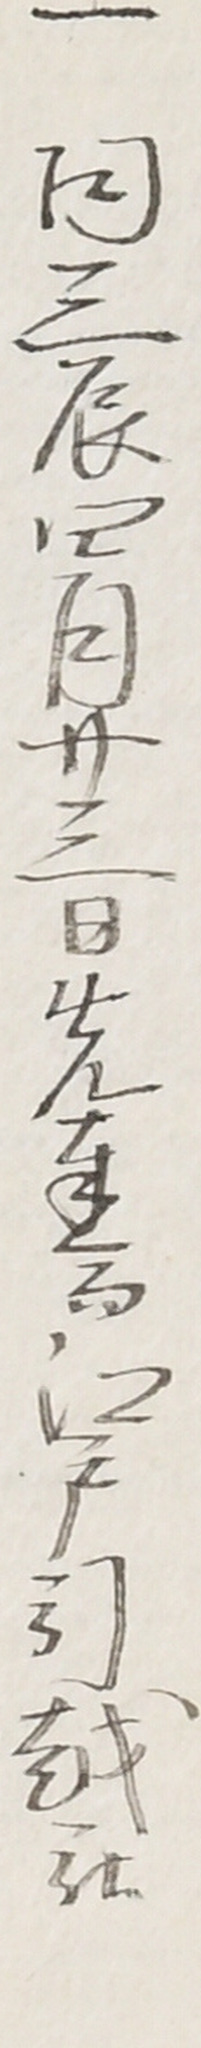一同三辰四月廿三日先達而江戸引越被
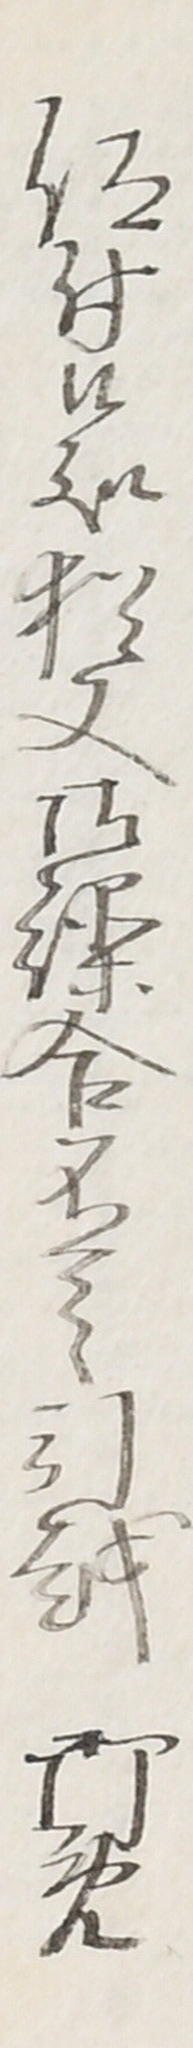仰付候処猶又御繰合有之引越御免
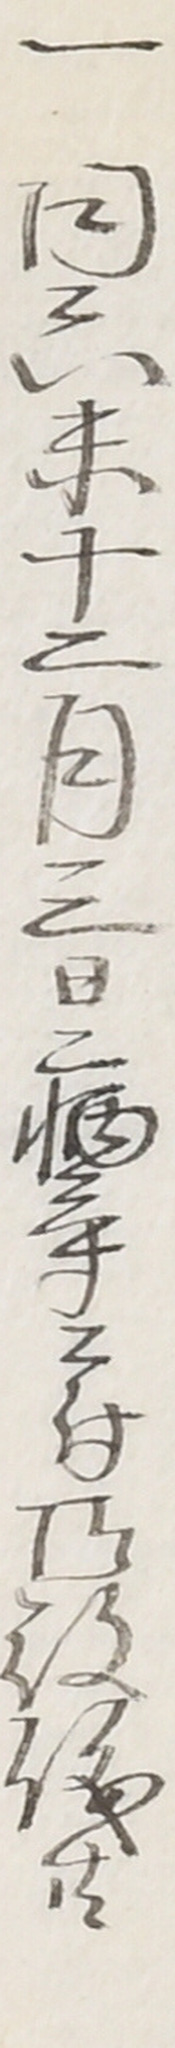一同六未十二月三日病気ニ付御役儀共
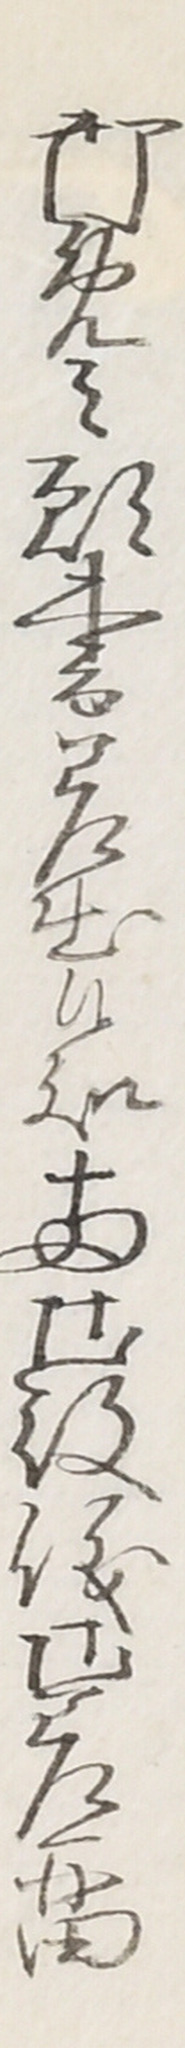御免之願書差出候処両御役儀御差留
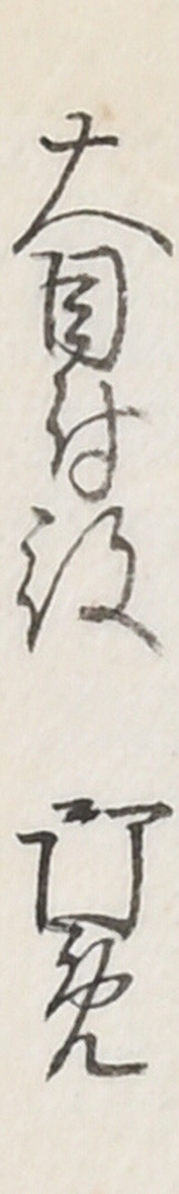大目付役御免
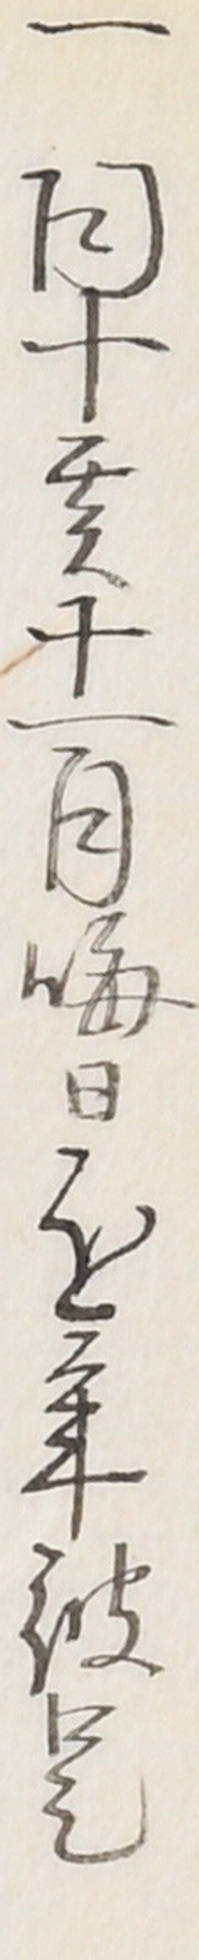一同十亥十一月晦日近年彼是
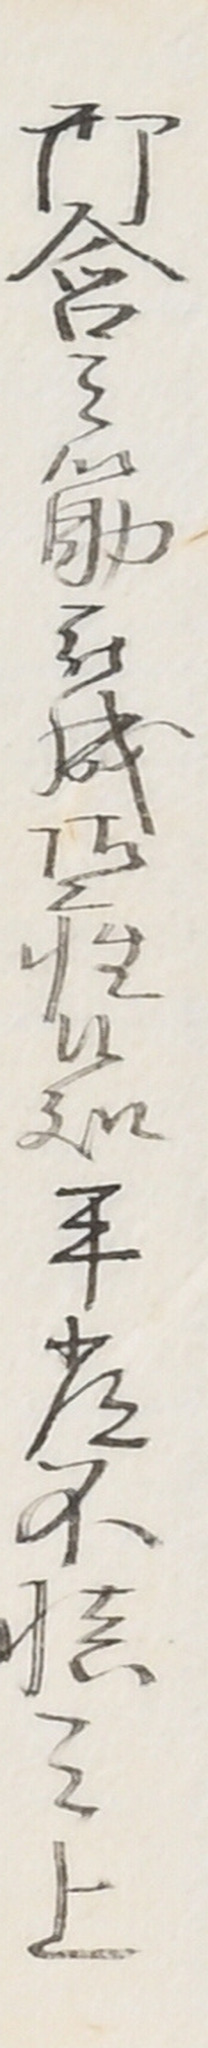御含之筋被成御座候処平常不慎之上
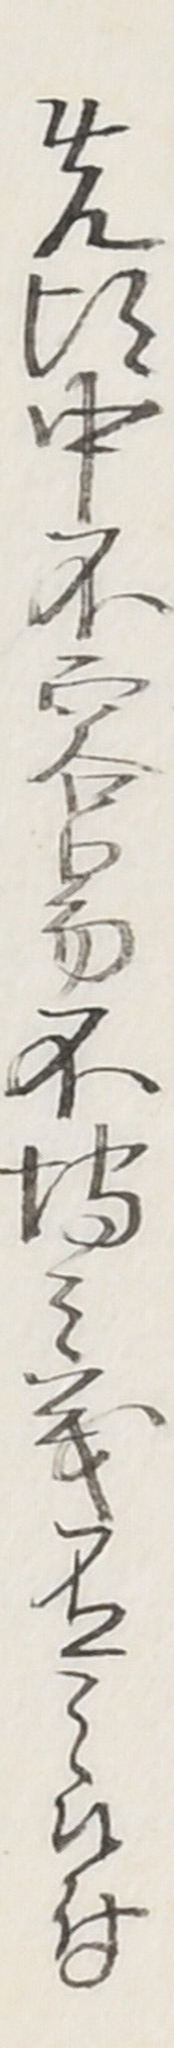先頃中不容易不埒之義有之候付
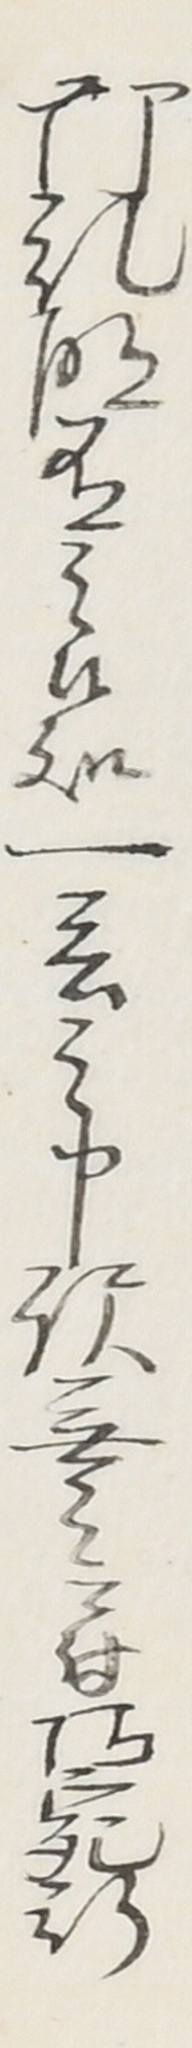御糺明有之候処一言之申訳無之ニ付御宛行
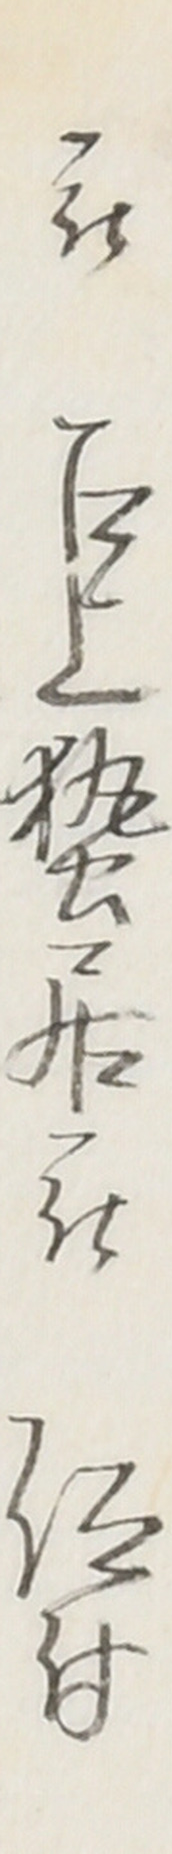被召上蟄居被仰付
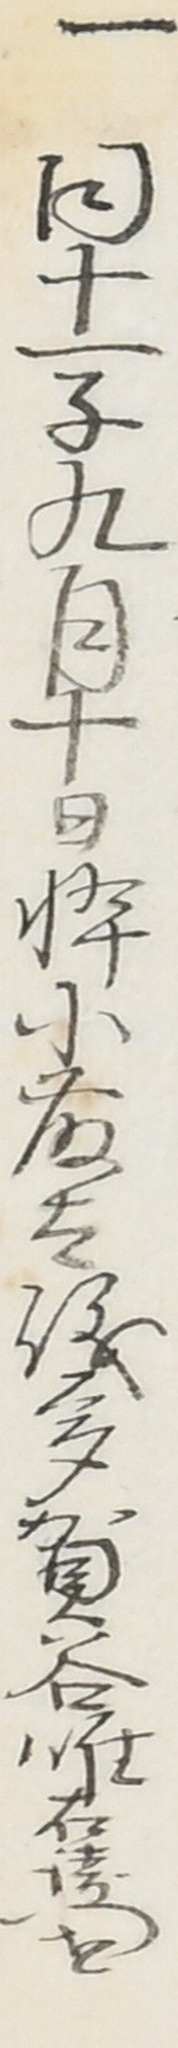一同十一子九月十日忰小藤太儀多賀谷唯右衛門を
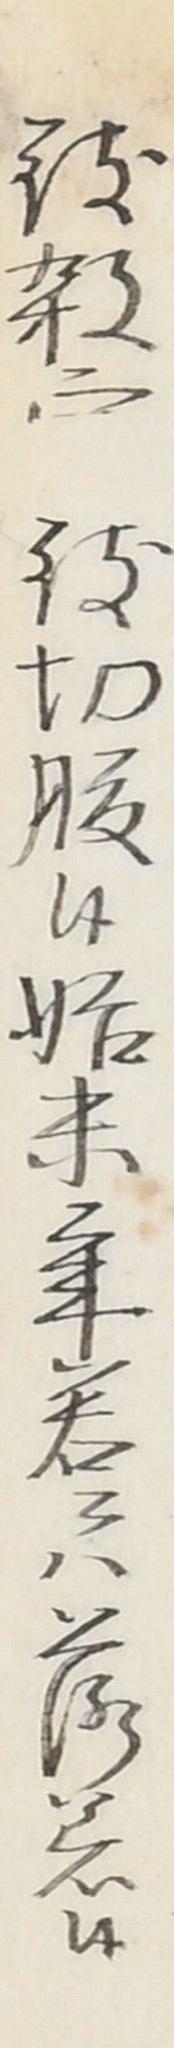致殺致切腹候始末年若ニは落着候
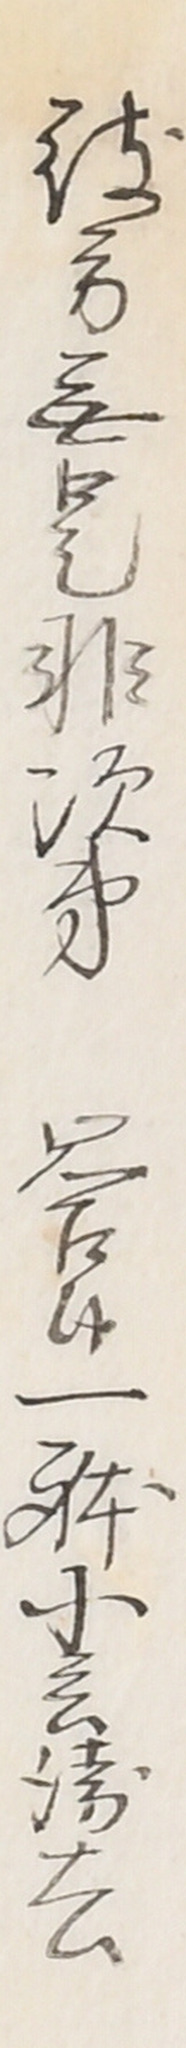致方無是非次第思召候一躰小兵衛去
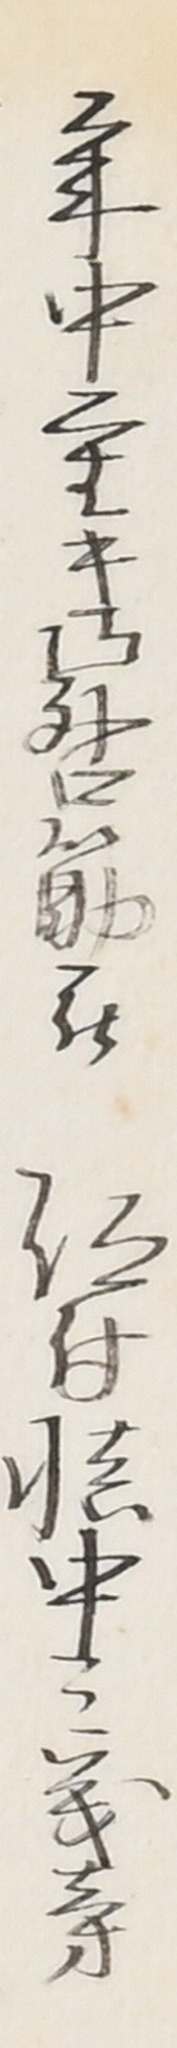年中重キ御咎筋被仰付慎中之義旁
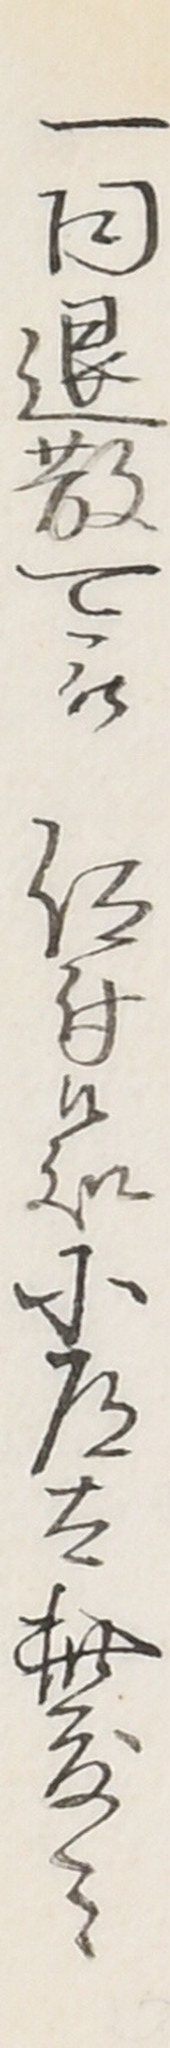一同退散可被仰付候処小道太此度之
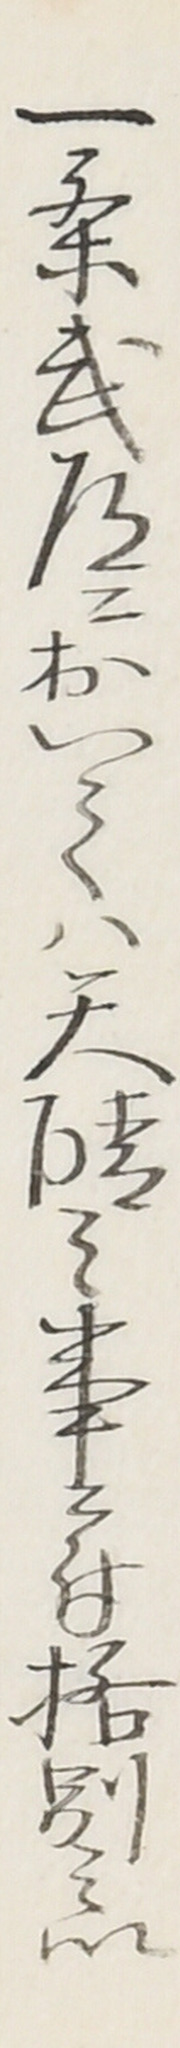一条武道ニおいては天晴之事ニ付格別之以
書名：給人諸士勤仕録（七）
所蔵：伊那市立高遠町図書館・合同会社AMANE
